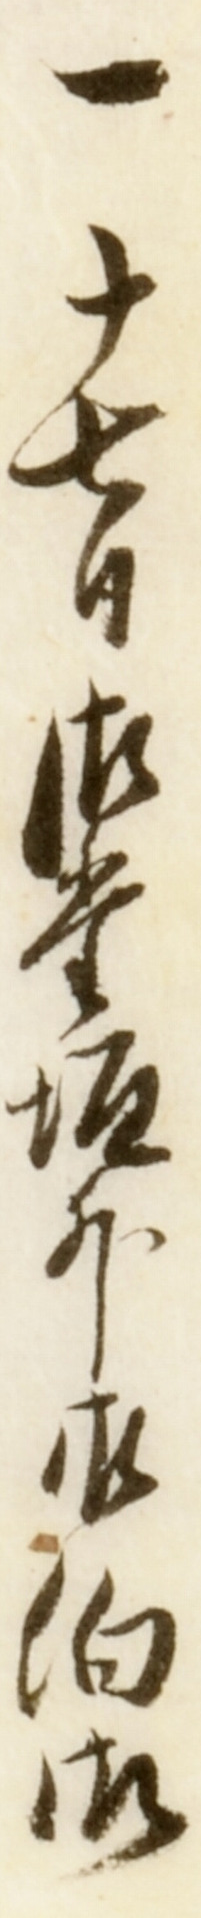一十七日御堂垣外御泊御
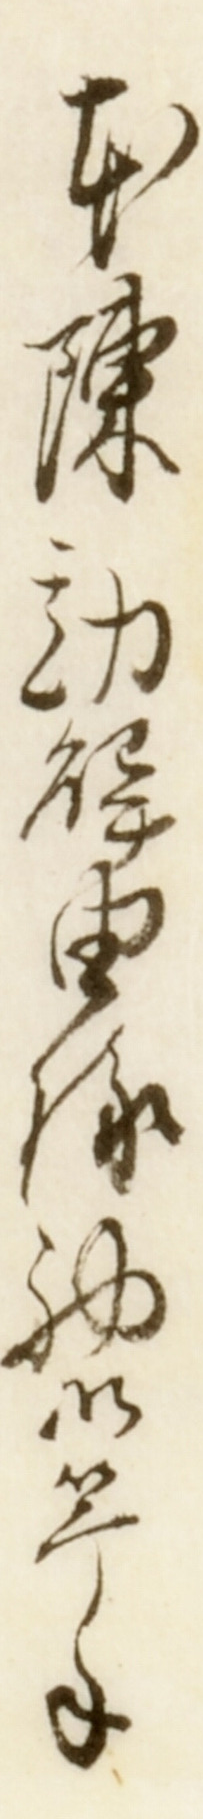本陣勘解由様初御竿手
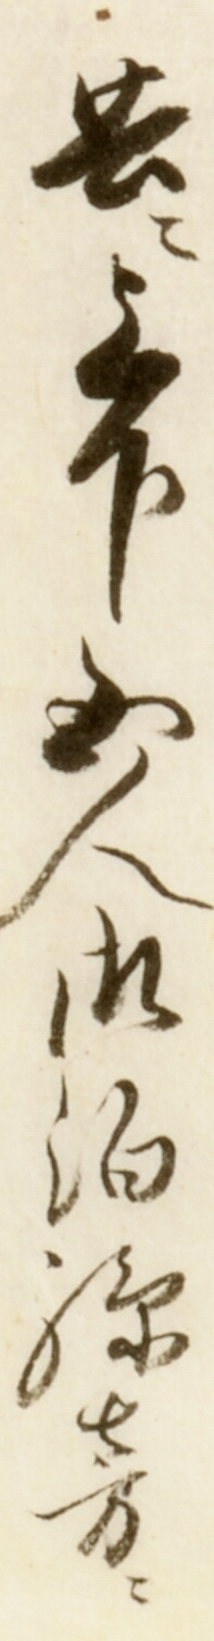共ニ上下五人御泊孫七方ニ
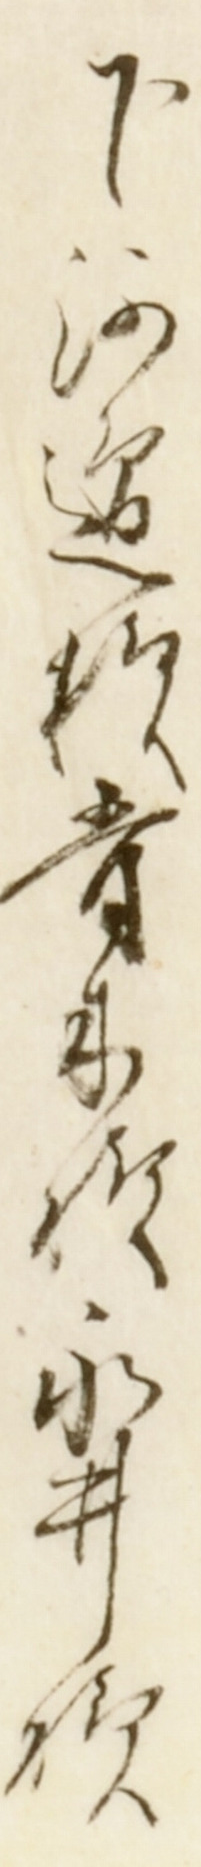下河邊様青木様永井様
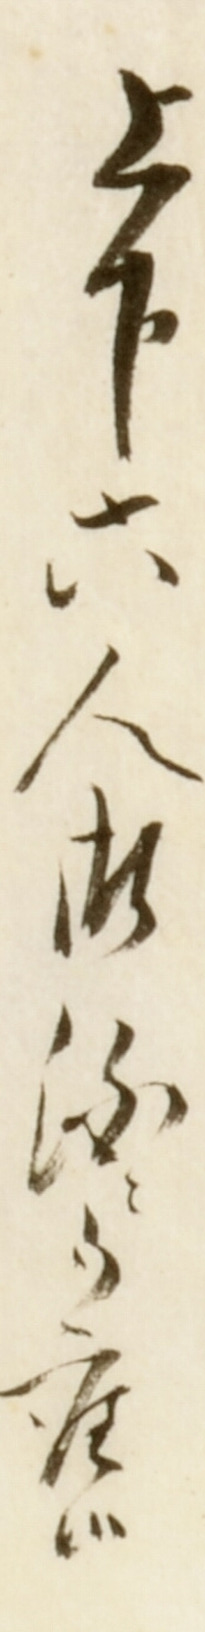上下六人御泊ニ御座候
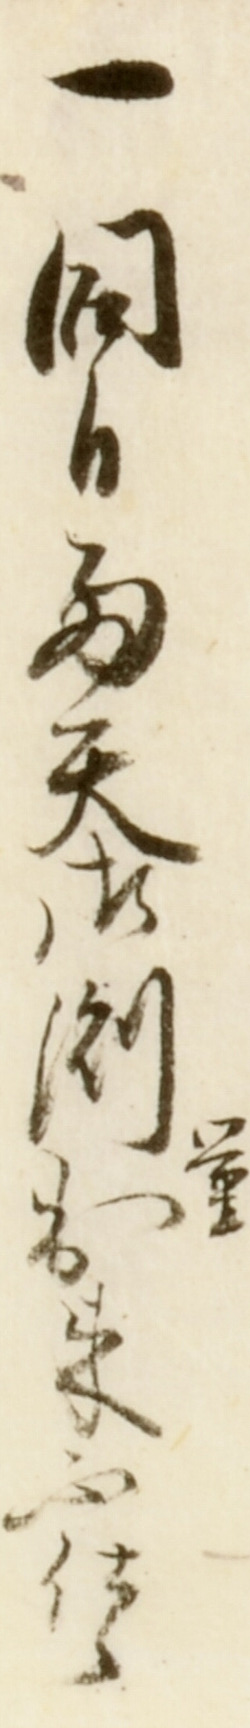一同日雨天御測量出来不仕候
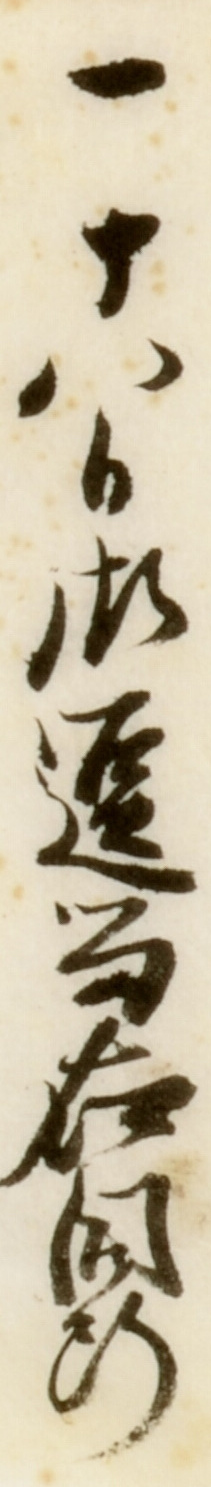一十八日御逗留右同断

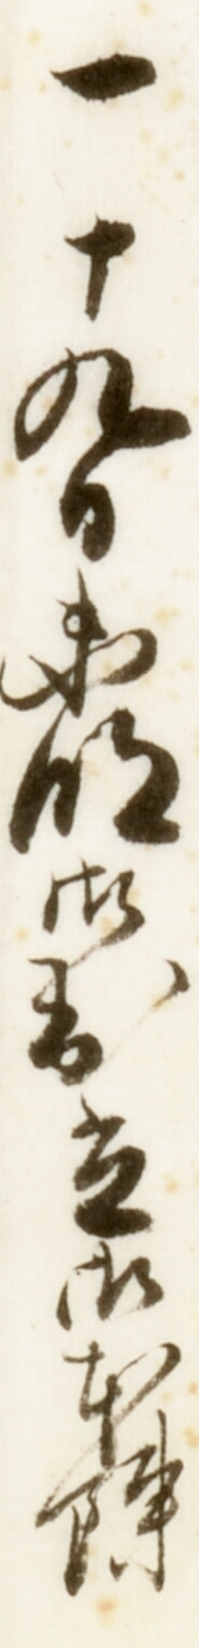一十九日未明御出立御本陣
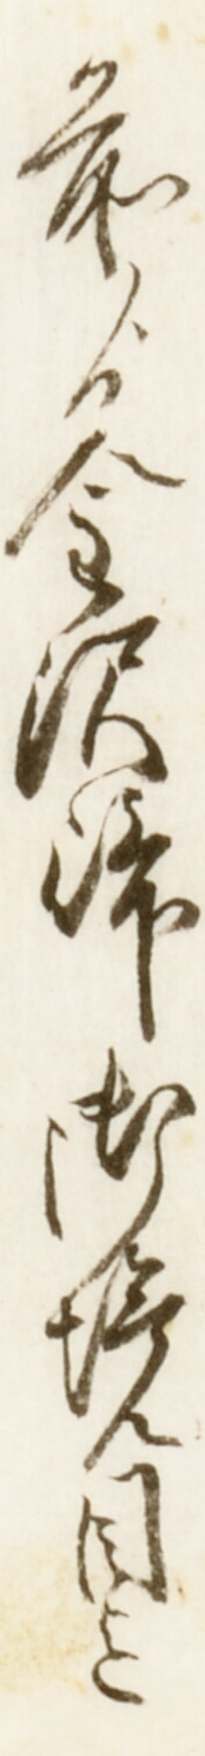前ゟ金沢峠御境目迄
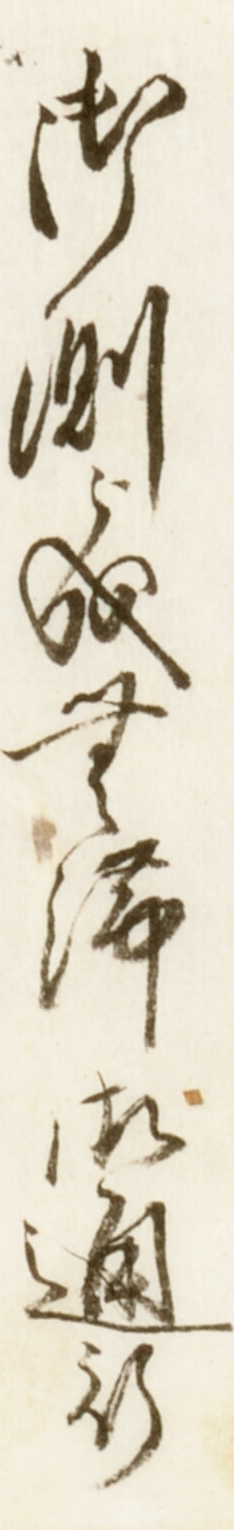御測被成無滞御通行
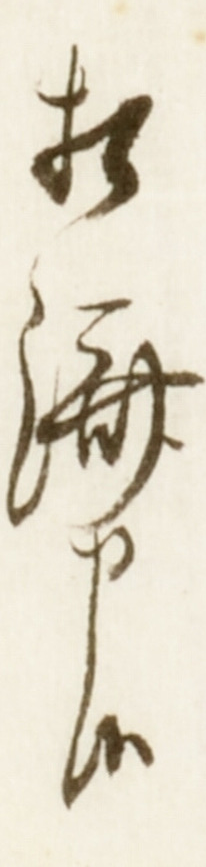相済申候
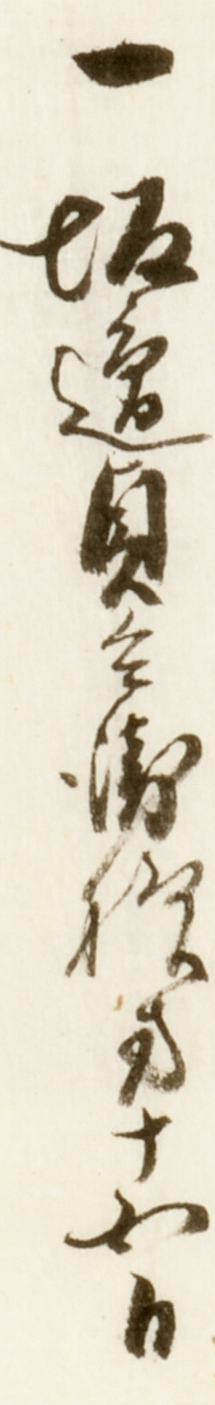一坂辺貞兵衛様方十五日
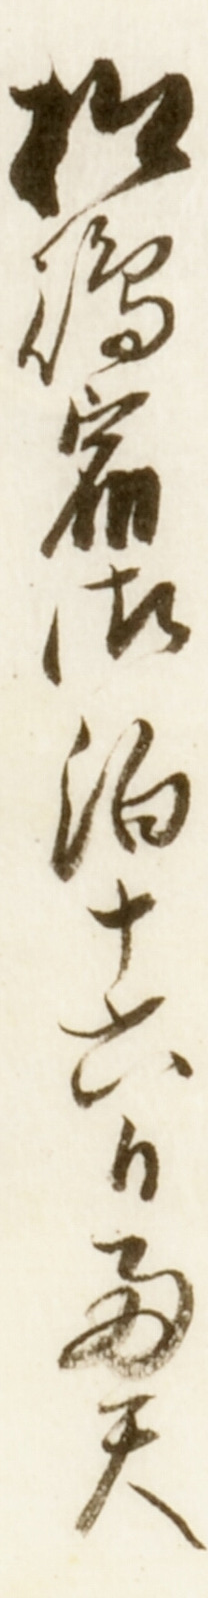松嶋宿御泊十六日雨天
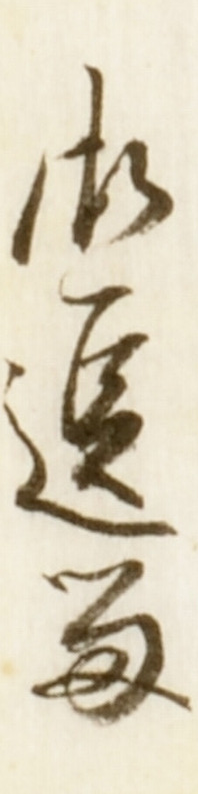御逗留
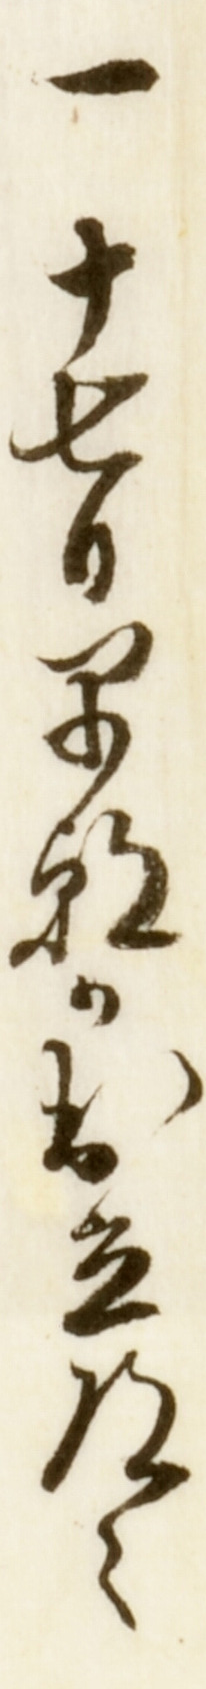一十七日早朝御出立道々
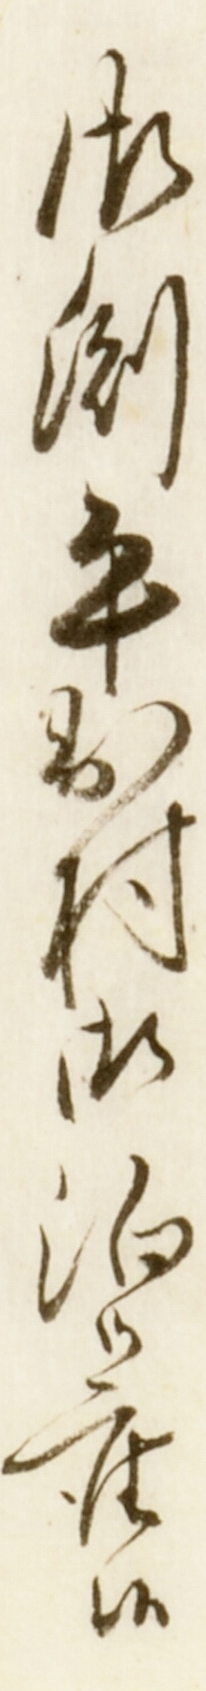御測平出村御泊御座候
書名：諸事書上
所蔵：伊那市立高遠町図書館・合同会社AMANE
